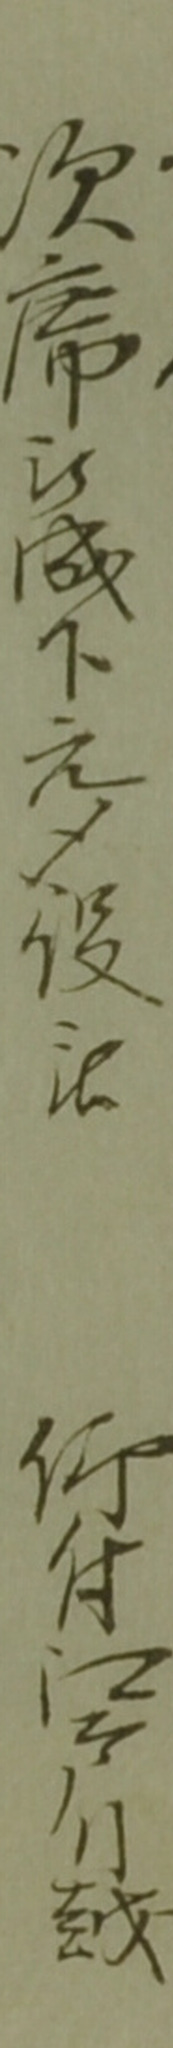次席被成下元〆役被仰付江戸引越
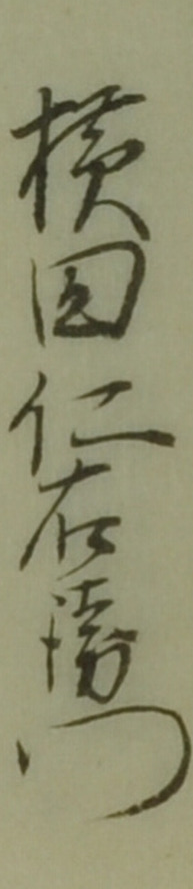横田仁右衛門
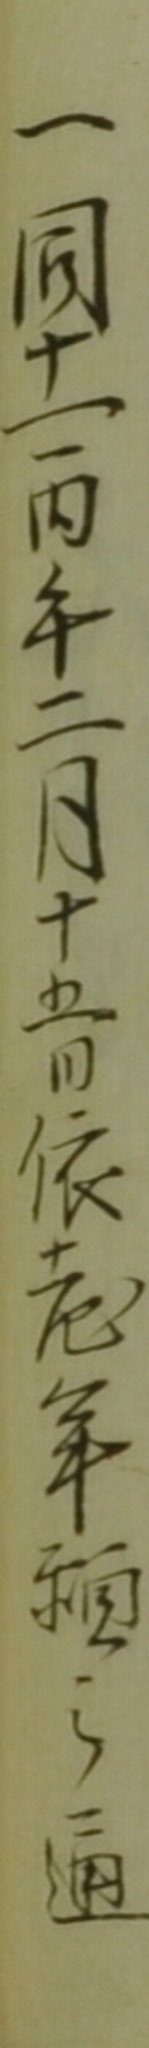一同十一丙午二月十五日依老年願之通
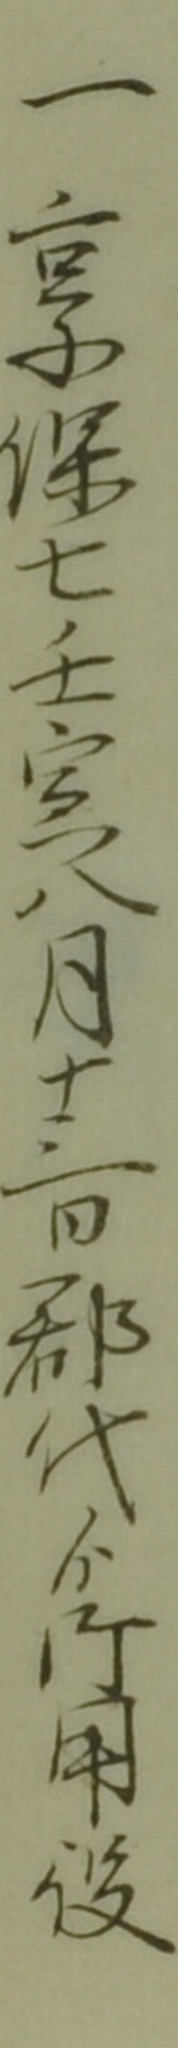一享保七壬寅八月十三日郡代ゟ御用役
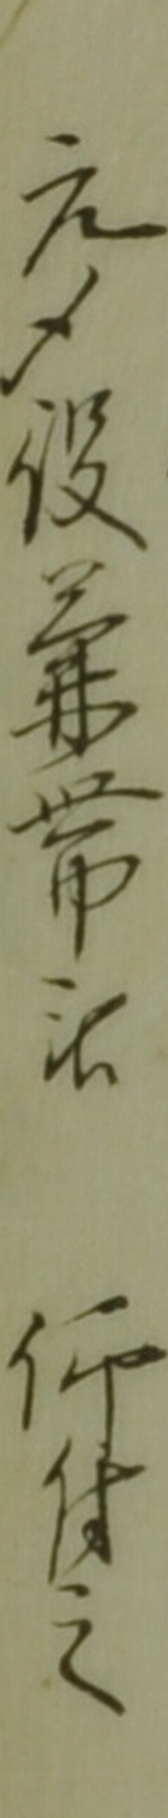元〆役兼帯被仰付之
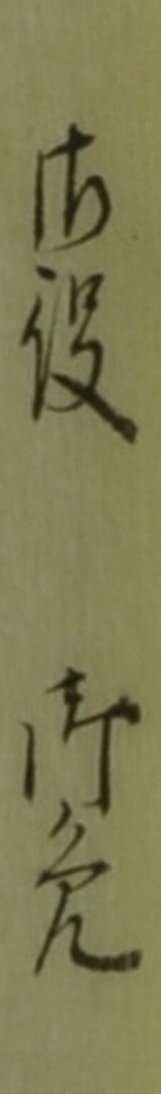御役御免
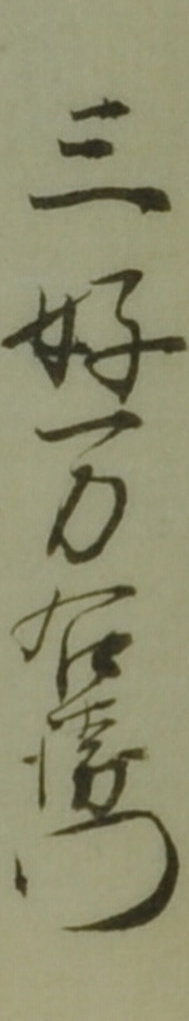三好万右衛門
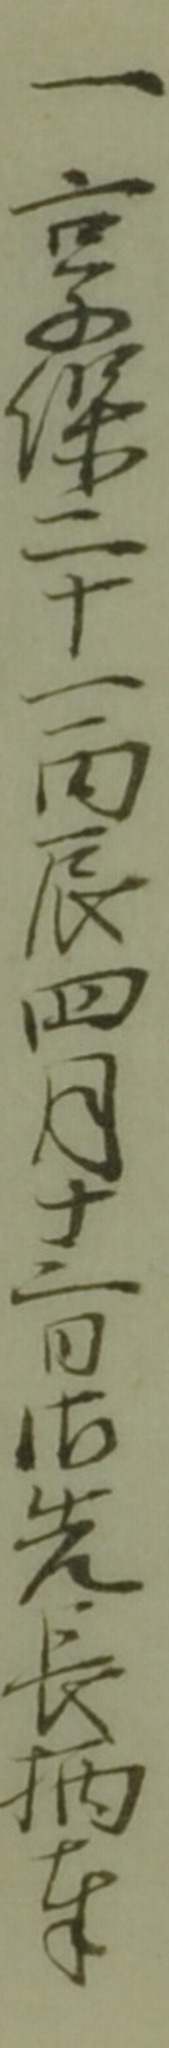一享保二十一丙辰四月十三日御先長柄奉
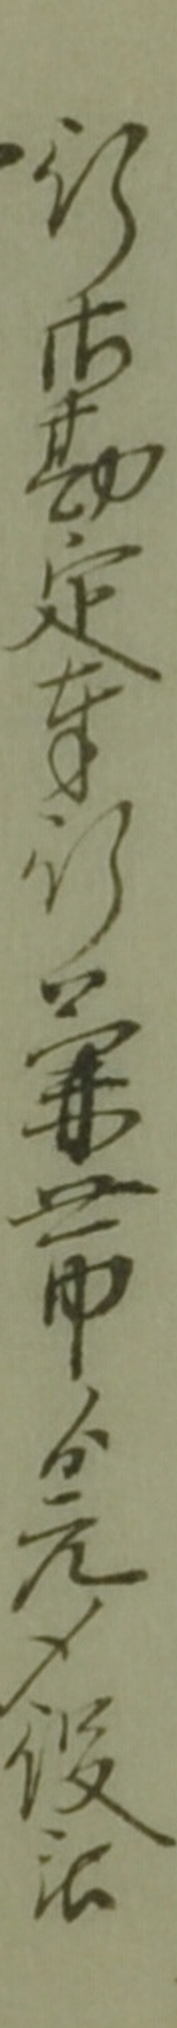行御勘定奉行兼帯ゟ元〆役被
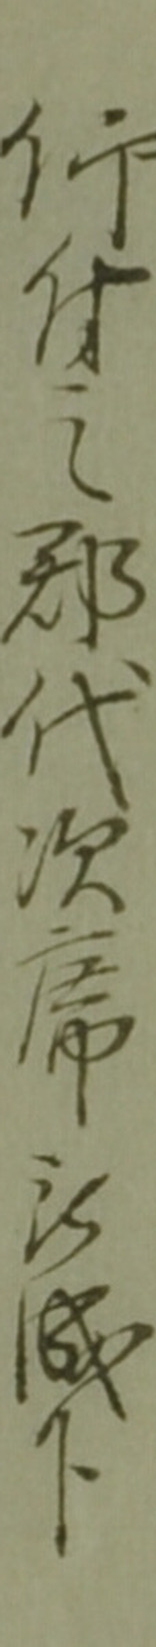仰付之郡代次席被成下
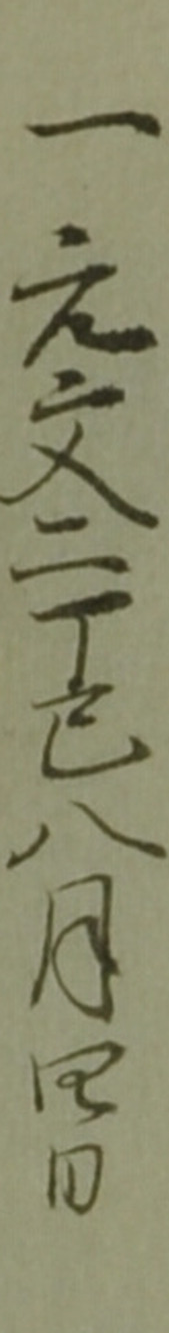一元文二丁巳八月四日
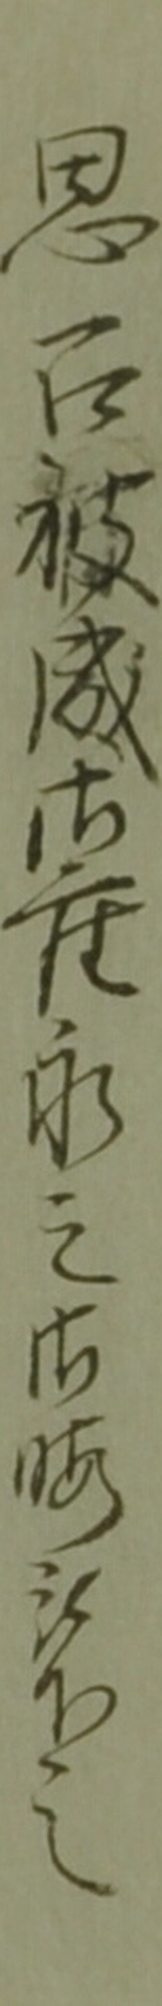思召被成御座永之御暇被下之
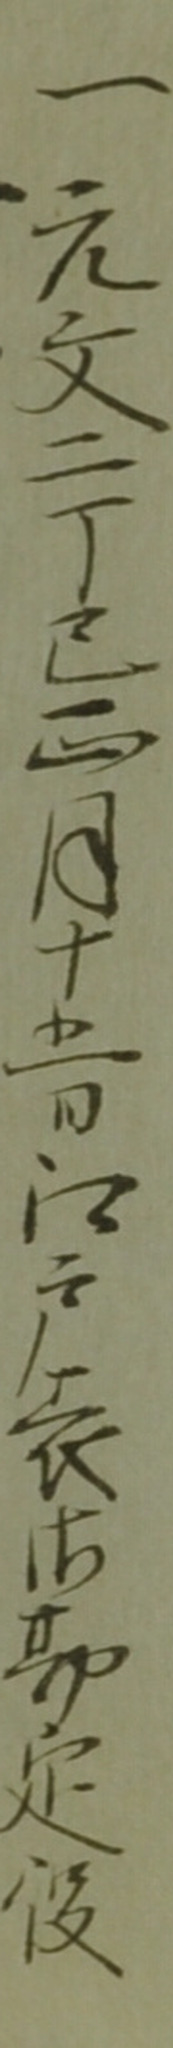一元文二丁巳正月十五日江戸表御勘定役
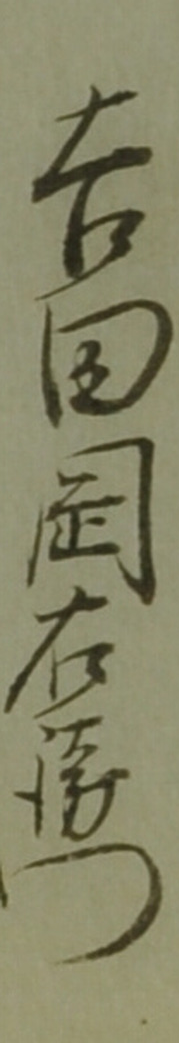吉田岡右衛門
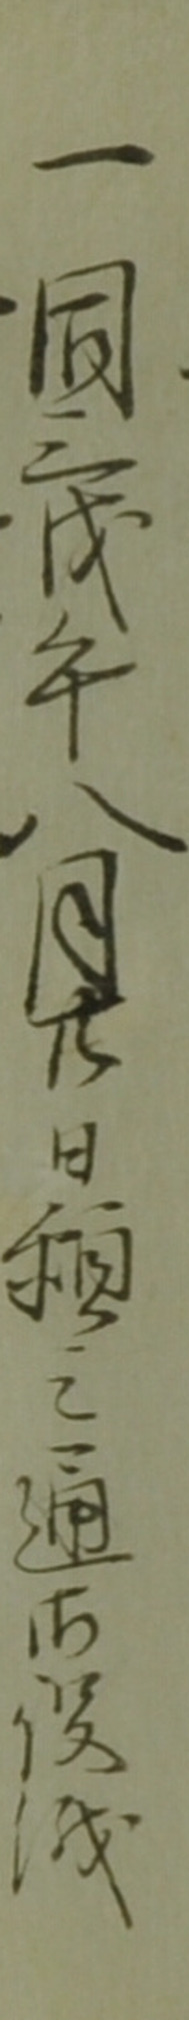一同三戊午八月廿日願之通御役儀
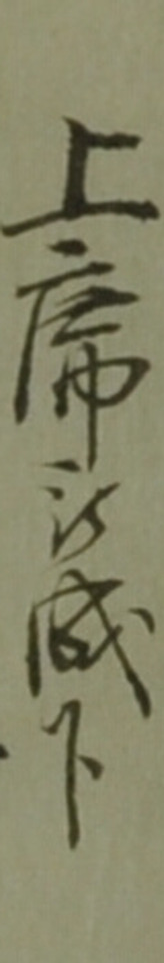上席被成下
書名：諸御役代々録（七）
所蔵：伊那市立高遠町図書館・合同会社AMANE
